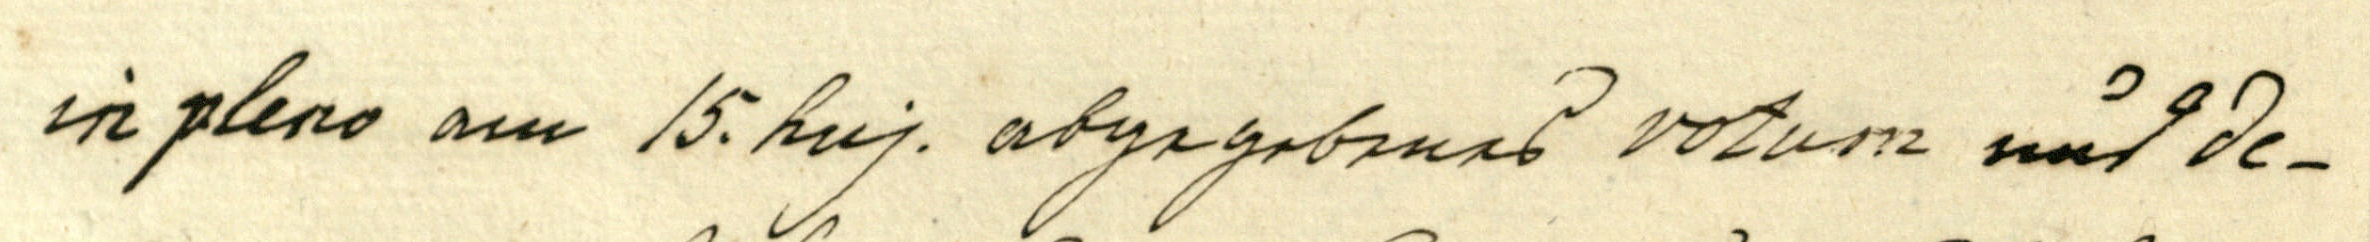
in pleno am 15. huj. abgegebenes votum und de¬
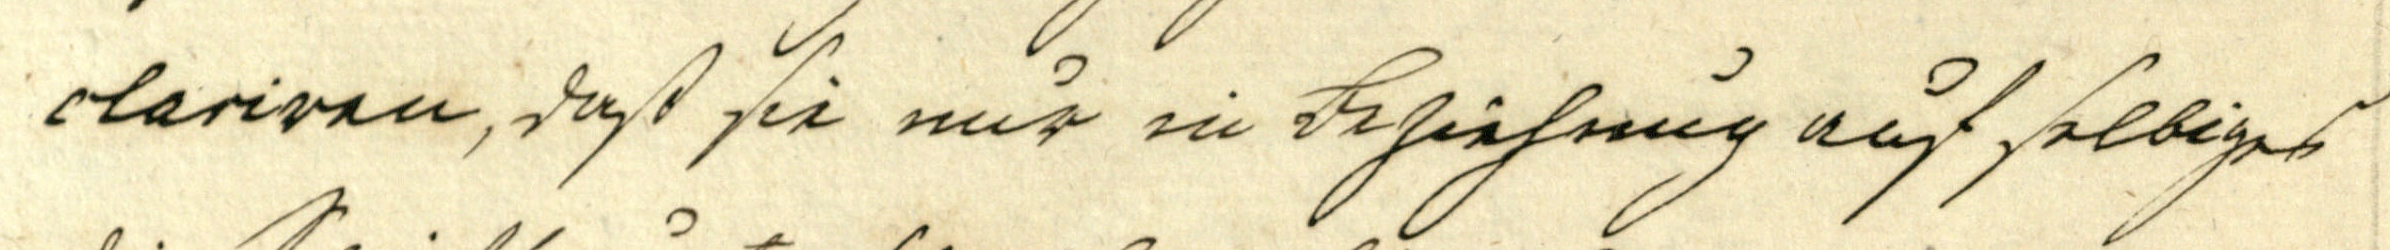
clariren, daß sie nur in Beziehung auf selbiges
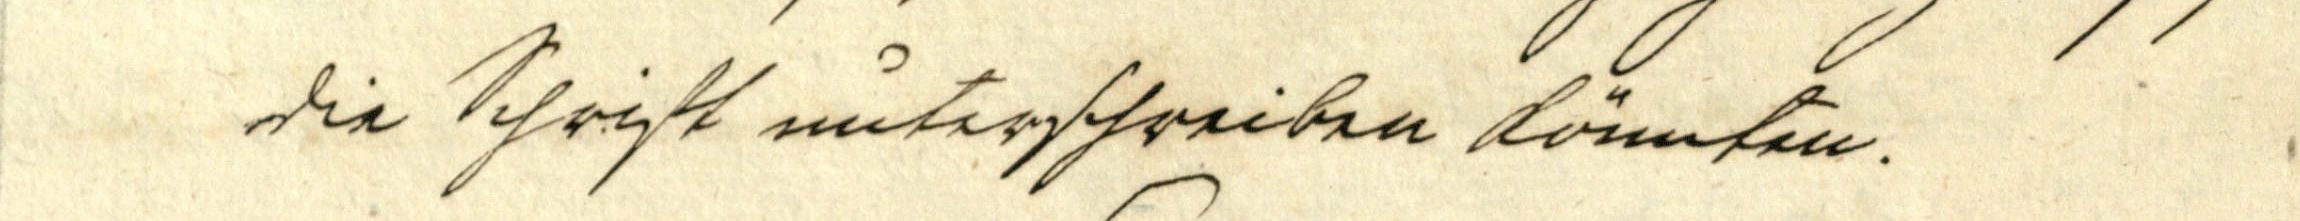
die Schrift unterschreiben könnten.
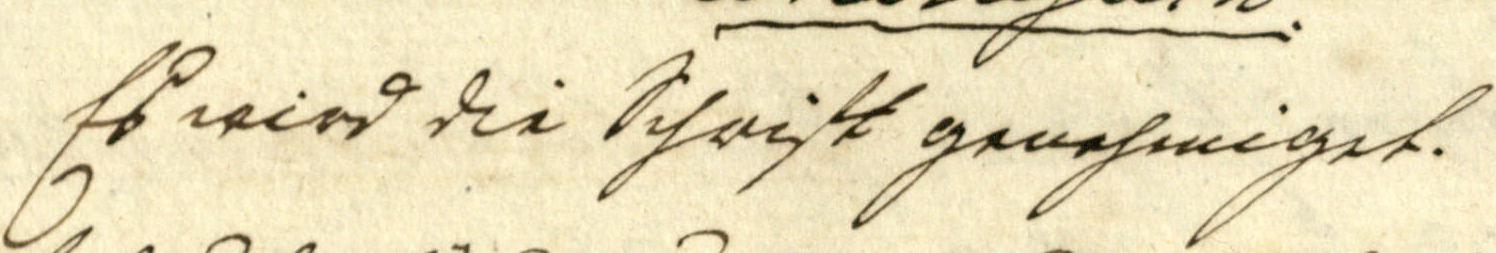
Es wird die Schrift genehmiget.
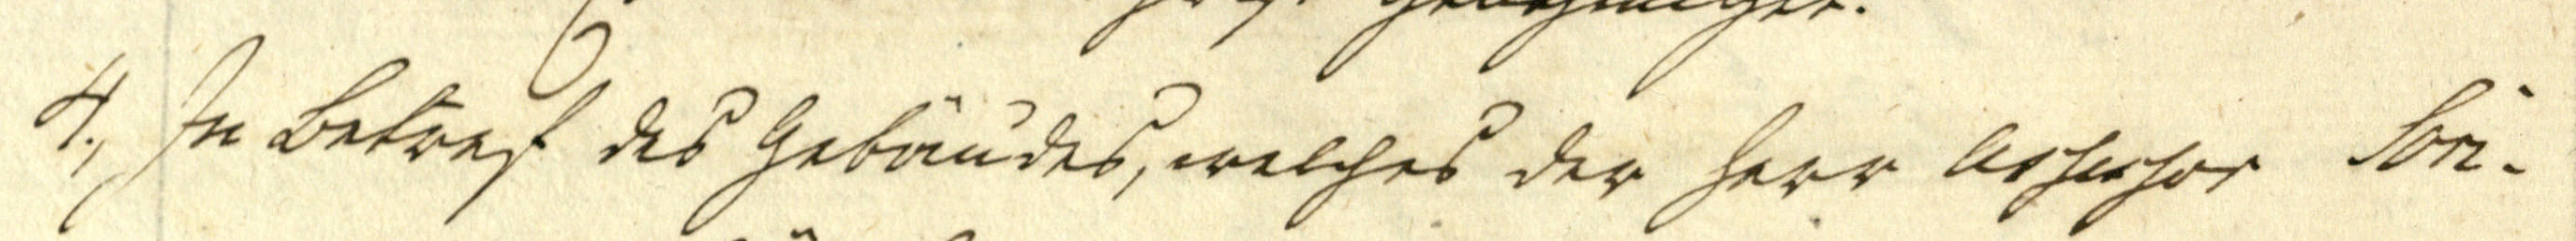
4, In Betref des Gebäudes, welches der herr Assessor Son¬
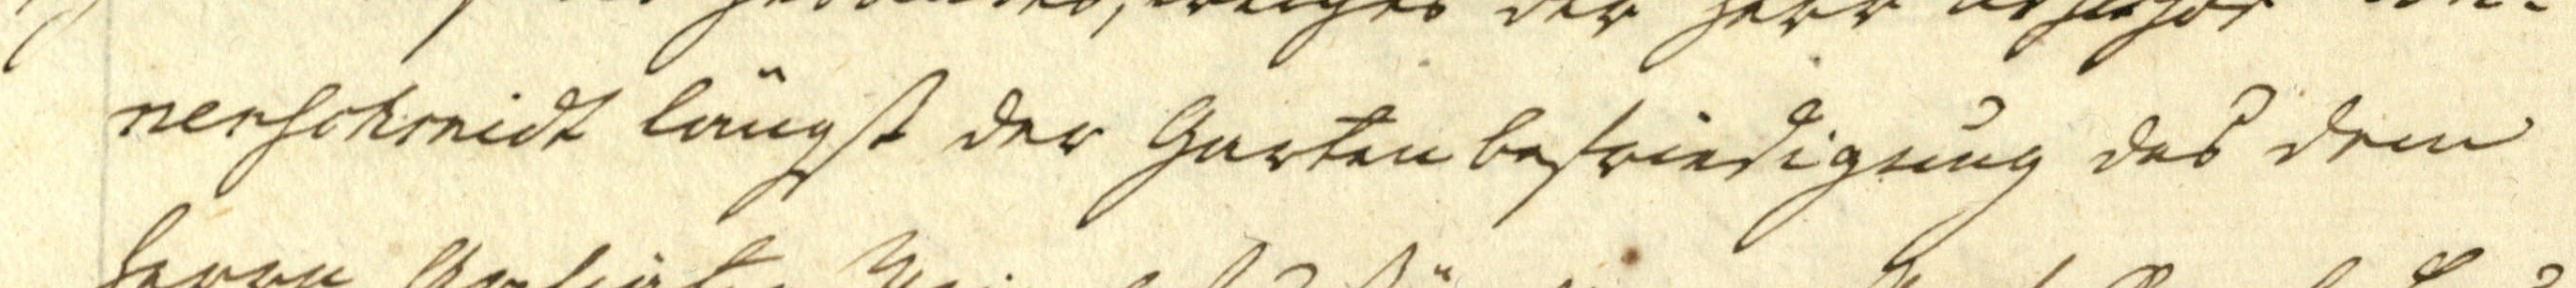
nenschmidt längst der Gartenbefriedigung des dem
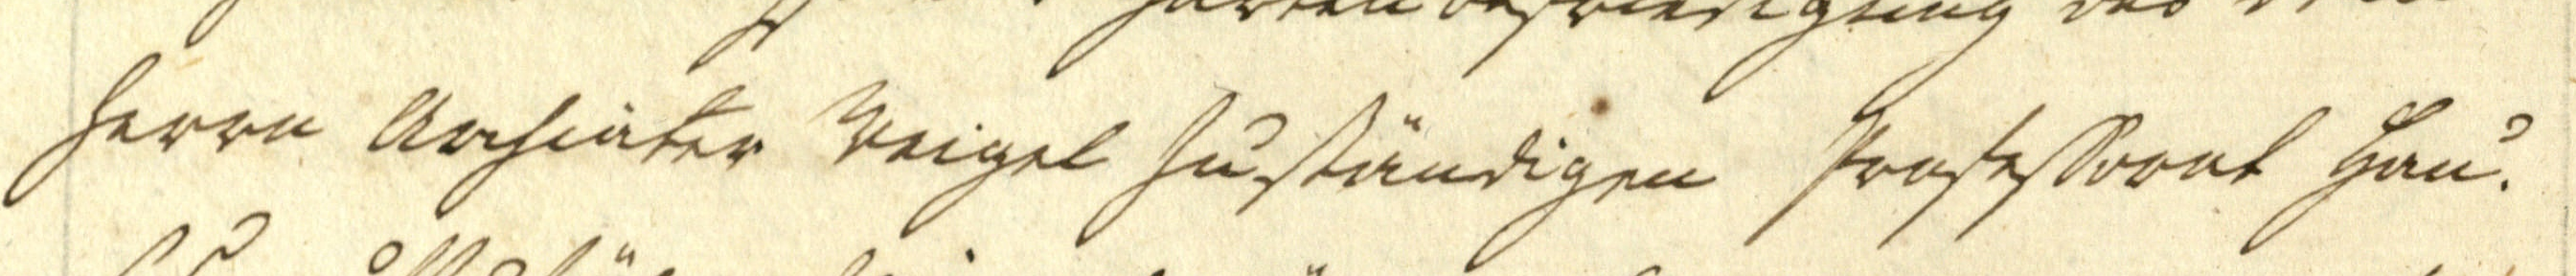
herrn Archiater Weigel zuständigen Professorat Hau¬
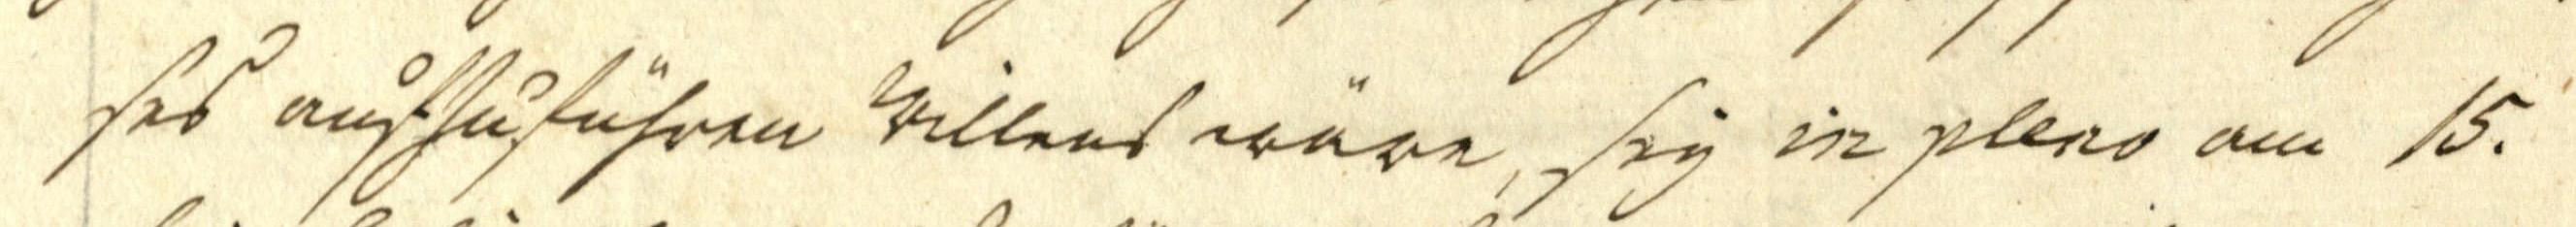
ses aufzuführen Willens wäre, seÿ in pleno am 15.
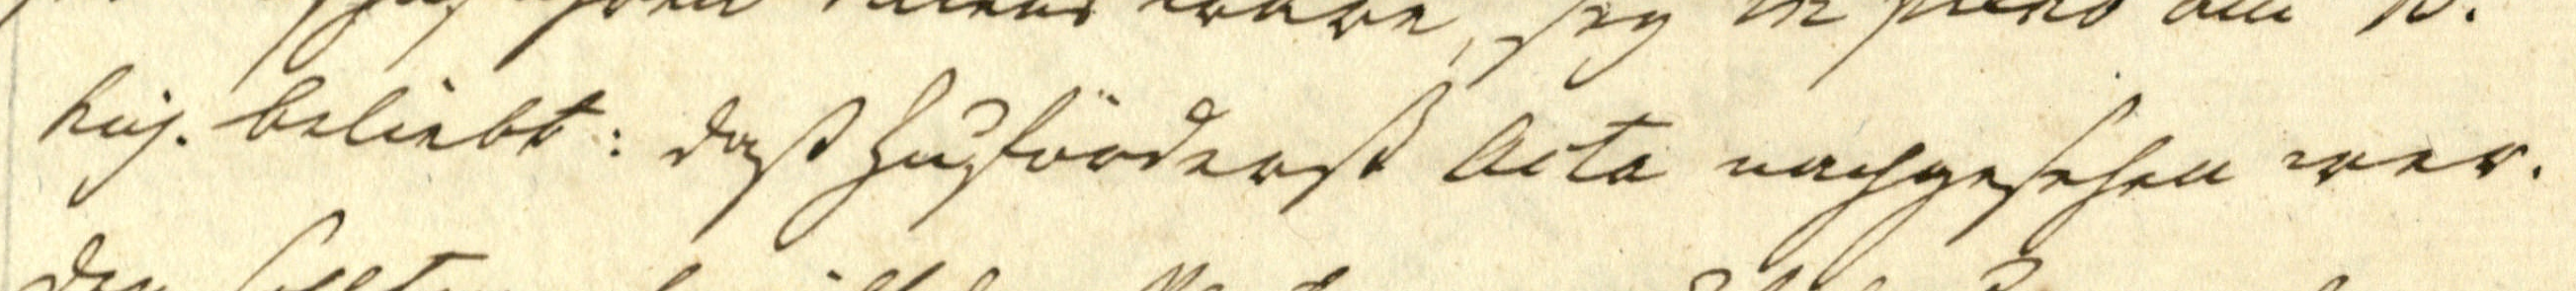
huj. beliebt: daß zuförderst Acta nachgesehen wer¬
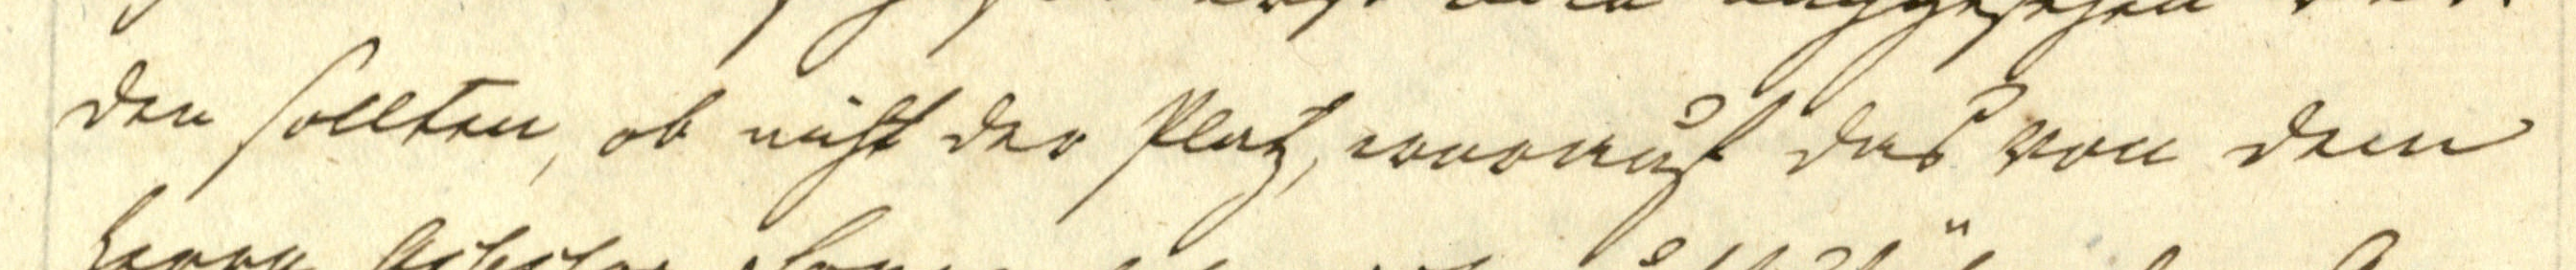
den sollten, ob nicht der Platz, worauf das von dem
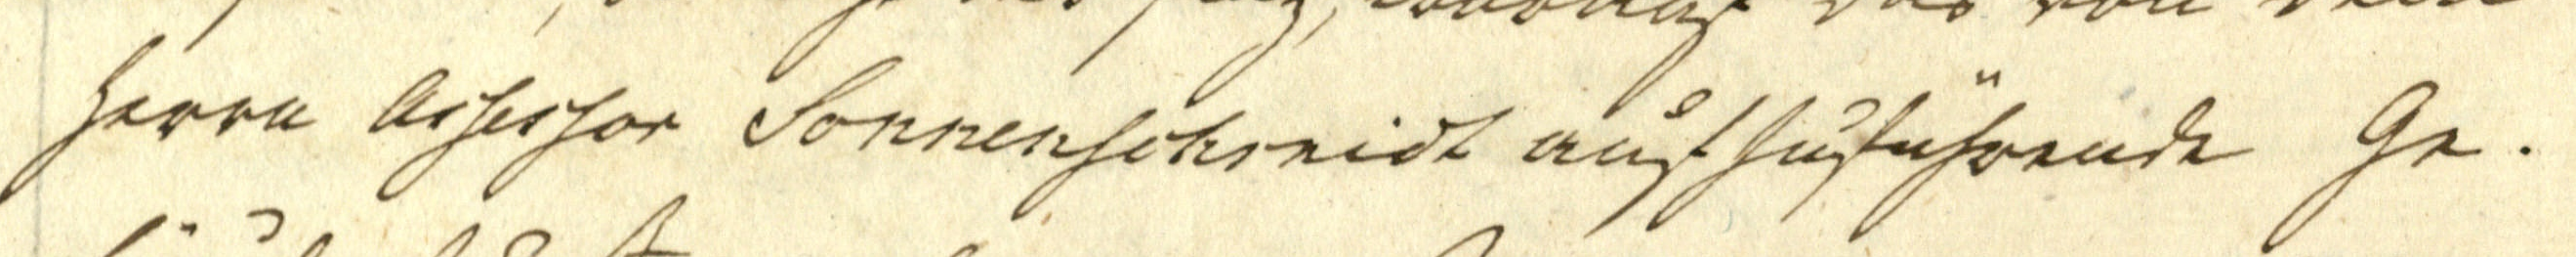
herrn Assessor Sonnenschmidt aufzuführende Ge¬
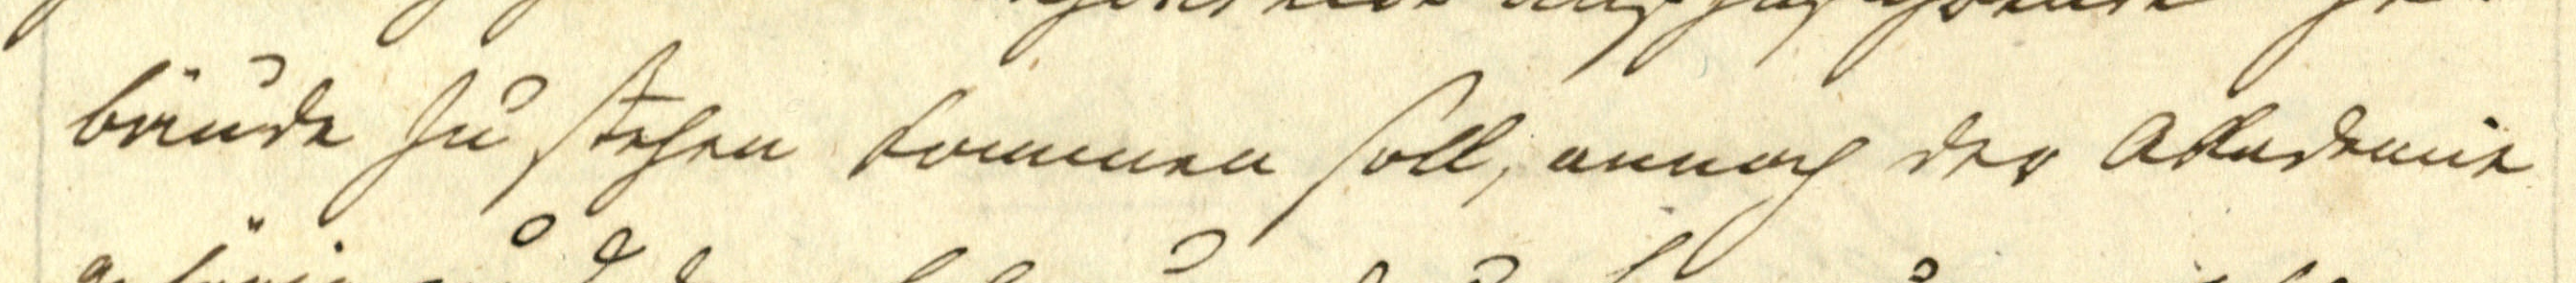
bäude zu stehen kommen soll, annoch der Akademie
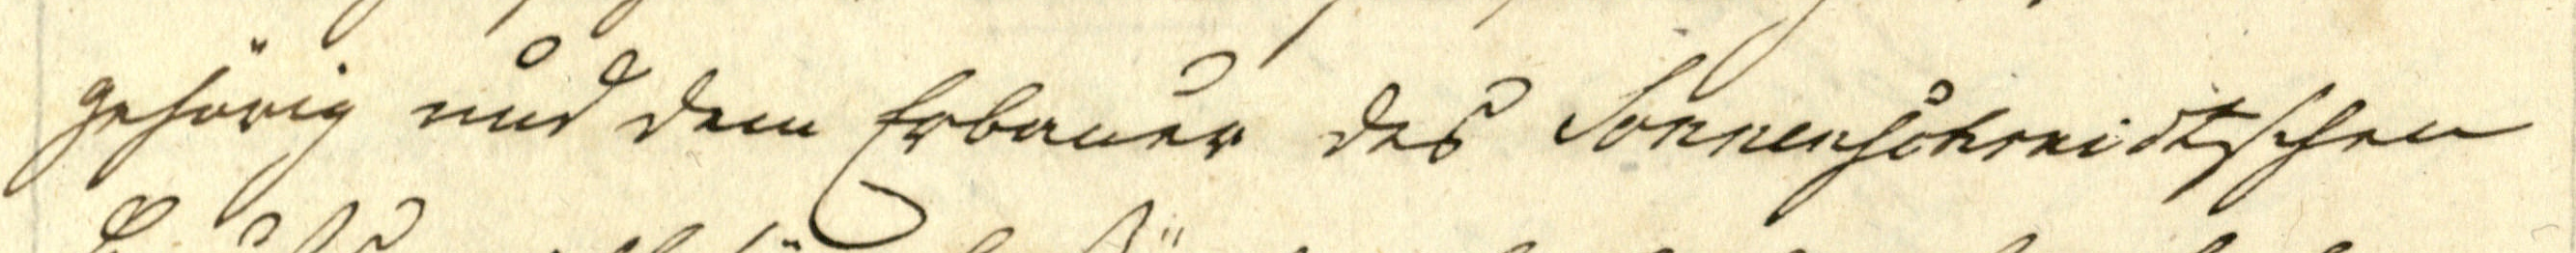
gehörig und dem Erbauer des Sonnenschmidtschen
